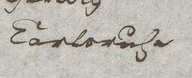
Carlsruhe
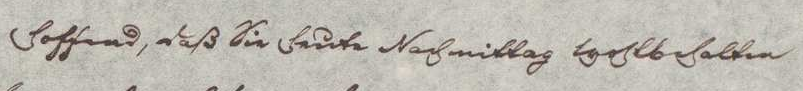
Hoffend, daß Sie heute Nachmittag wohlbehalten
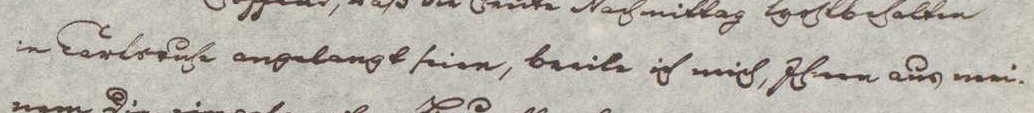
in Carlsruhe angelangt seien, beeile ich mich Ihnen aus mei-
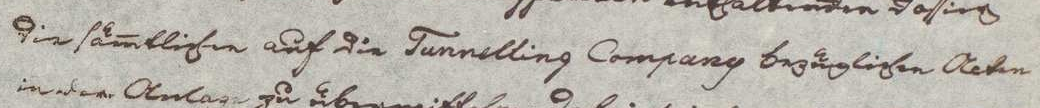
die sämmtlichen auf die Tunneling Company bezüglichen Acten
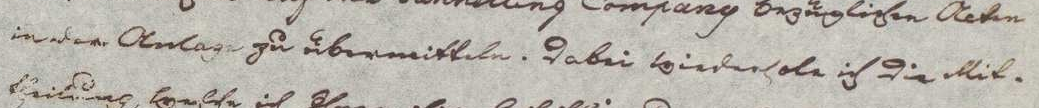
in der Anlage zu übermitteln. Dabei wiederhole ich die Mit-
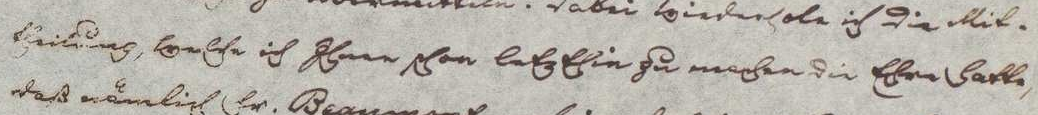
theilung, welche ich Ihnen schon letzthin zu machen die Ehre hatte,
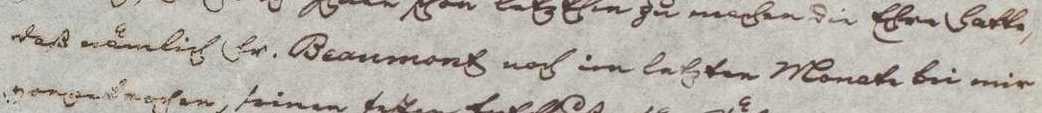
daß nämlich Hr. Beaumont noch im letzten Monate bei mir
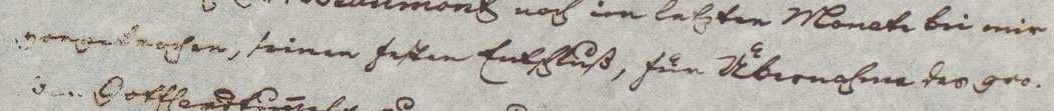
vorgesprochen, seinen festen Entschluß, für Übernahme des gro-
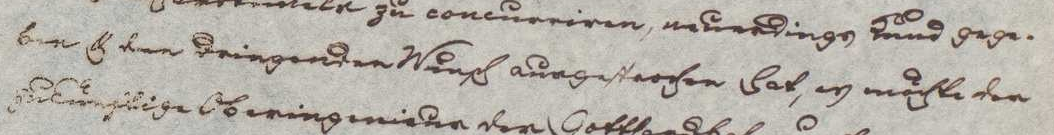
ben & den dringenden Wunsch ausgesprochen hat, es möchte der
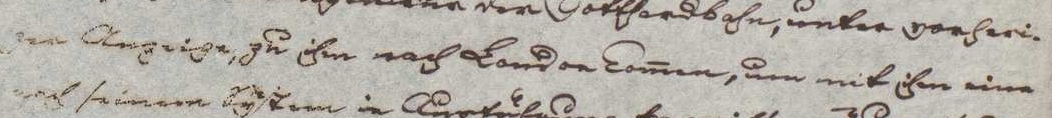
ger Anzeige, zu ihm nach London kommen, um mit ihm eine
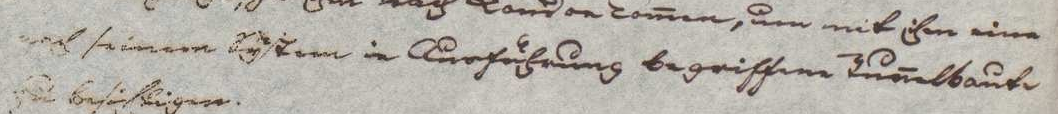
nach seinem System in Ausführung begriffene Tunnelbaute
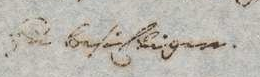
zu besichtigen.
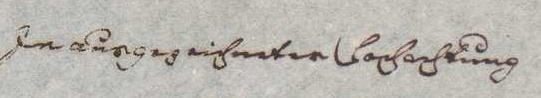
In ausgezeichneter Hochachtung
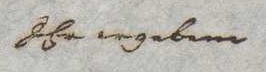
Ihr ergebene
